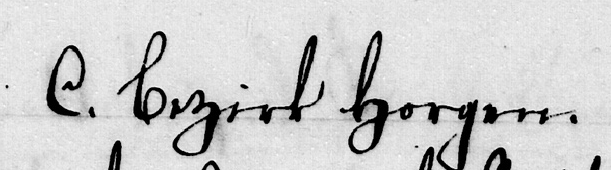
C. Bezirk Horgen.
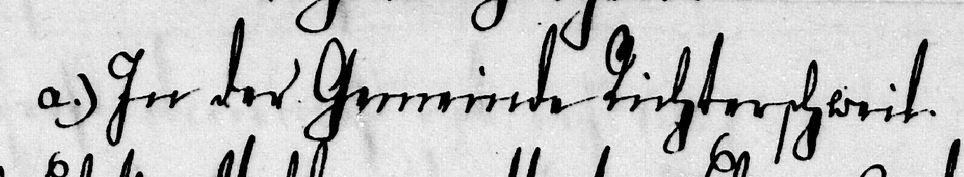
a.) In der Gemeinde Richterschweil.
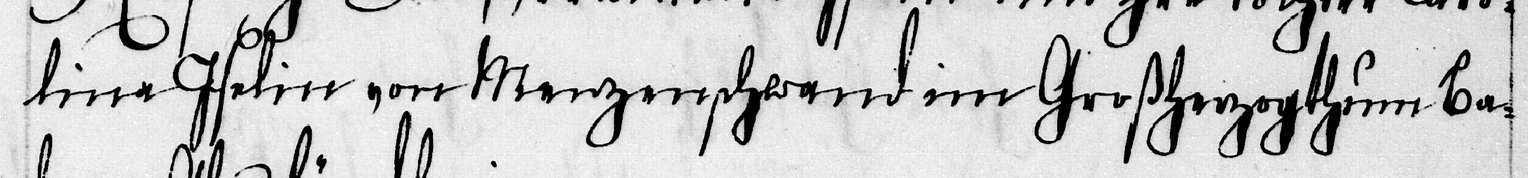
lina Iselin von Menzenschwand im Großherzogthum Ba¬
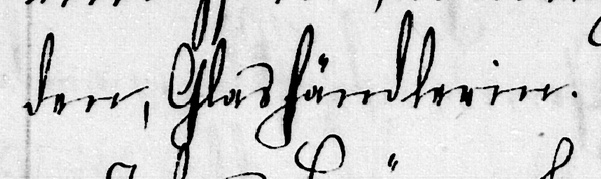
den, Glashändlerin.
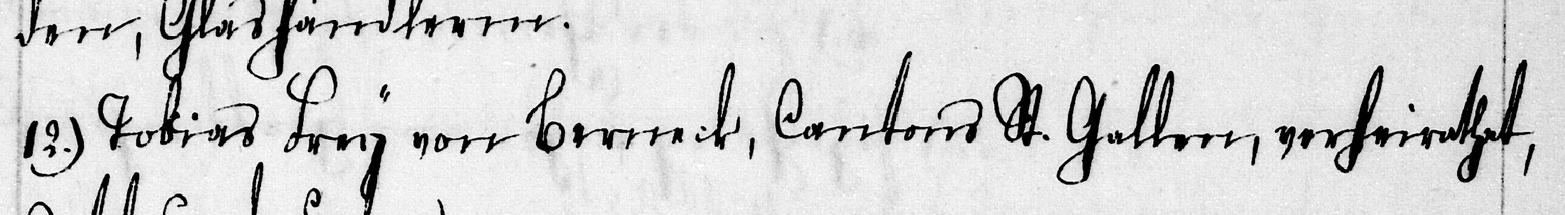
12.) Tobias Frey von Berneck, Cantons St. Gallen, verheirathet,
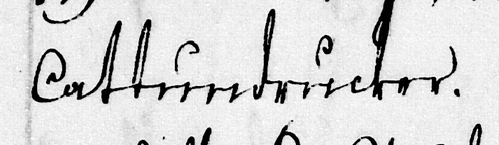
Cattundrucker.
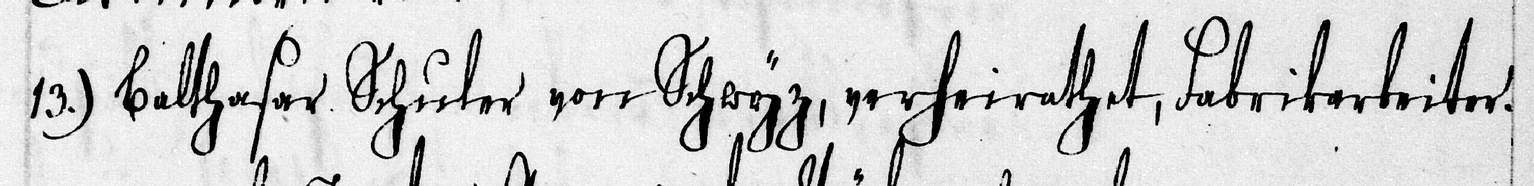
13.) Balthasar Schuler von Schwyz, verheirathet, Fabrikarbeiter.
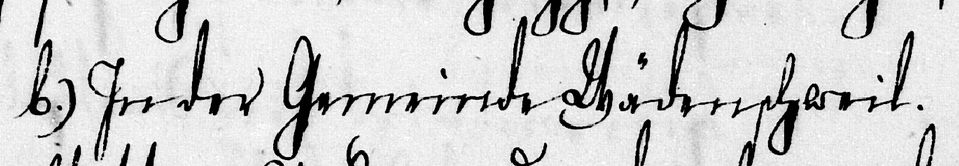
b.) In der Gemeinde Wädenschweil.
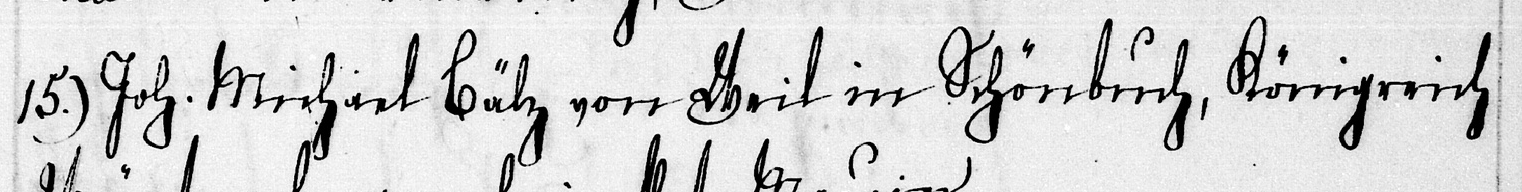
15.) Joh. Michael Bälz von Weil in Schönbuch, Königreich
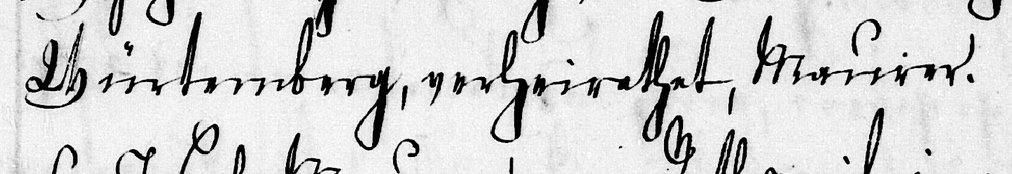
Würtemberg, verheirathet, Maurer.
